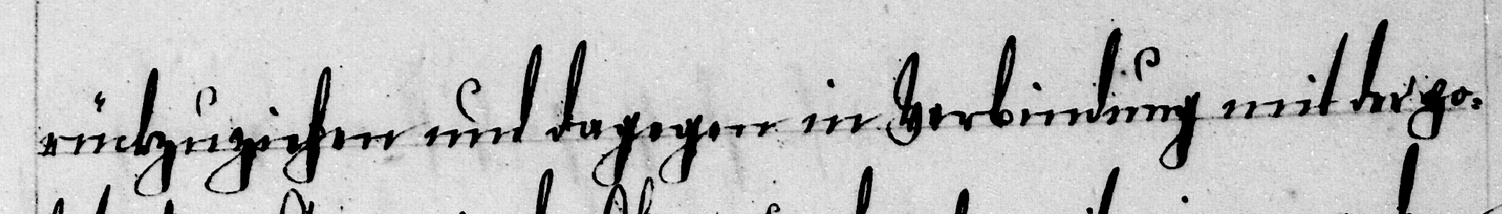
rückzuziehen und dagegen in Verbindung mit der po¬
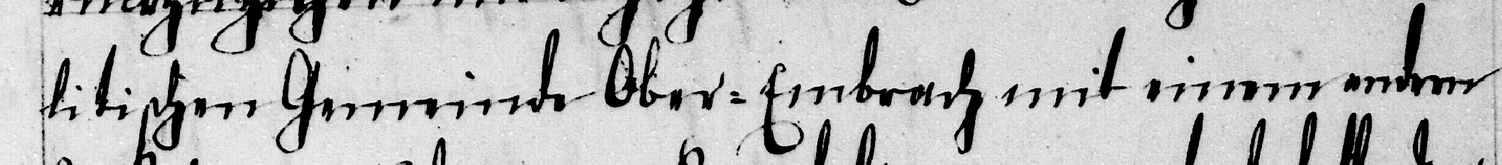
litischen Gemeinde Ober-Embrach mit einem andern
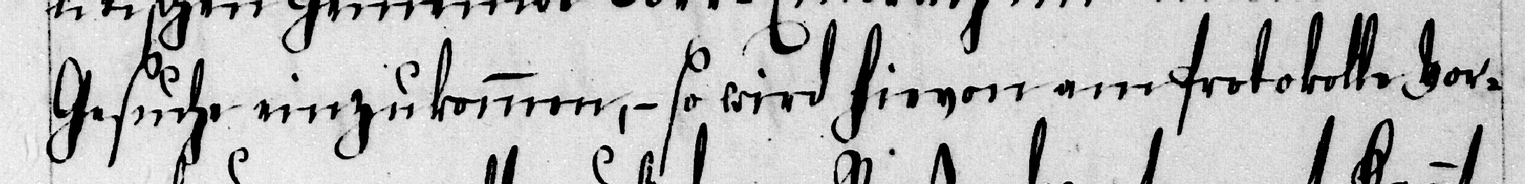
Gesuche einzukommen, – so wird hievon am Protokolle Vor¬
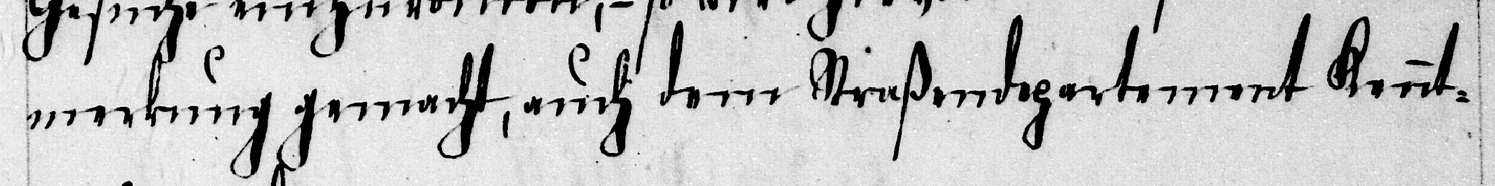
merkung gemacht, auch dem Straßendepartement Kennt¬
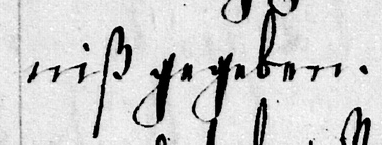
niß gegeben.
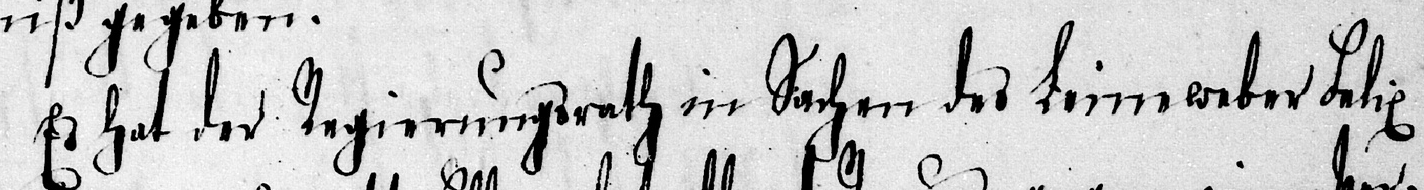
Es hat der Regierungsrath in Sachen des Leineweber Felix
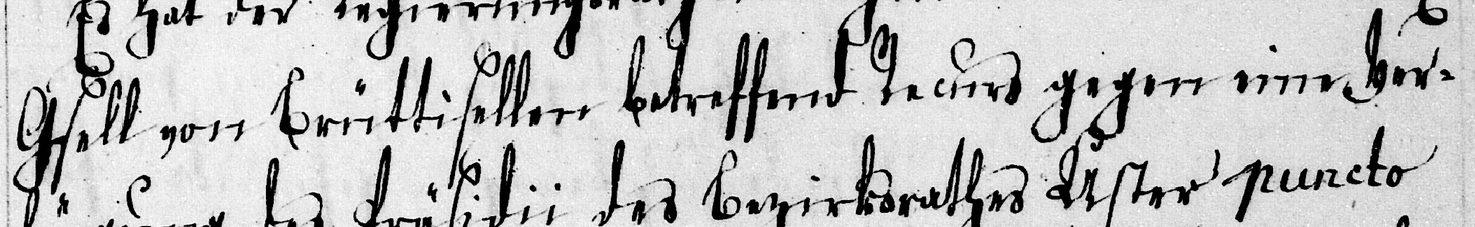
Gsell von Brüttisellen betreffend Recurs gegen eine Ver¬
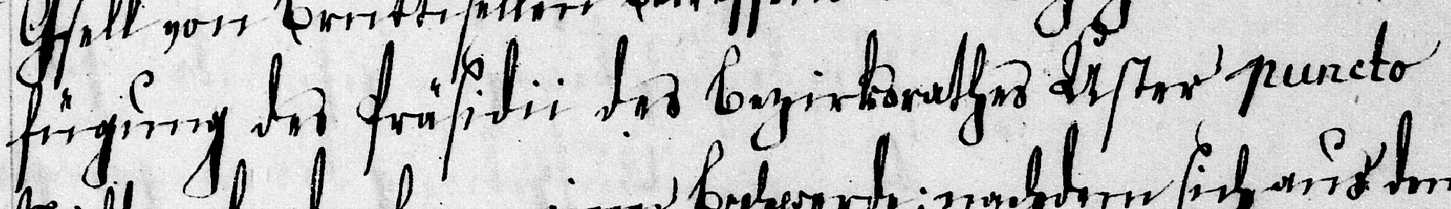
fügung des Präsidii des Bezirksrathes Uster puncto
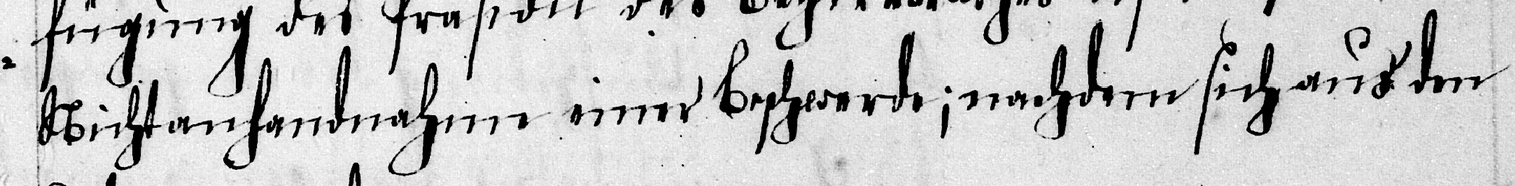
Nichtanhandnahme einer Beschwerde; nachdem sich aus den
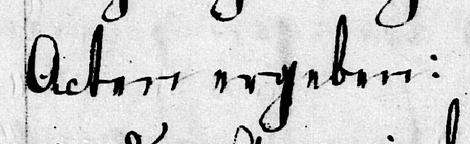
Acten ergeben:
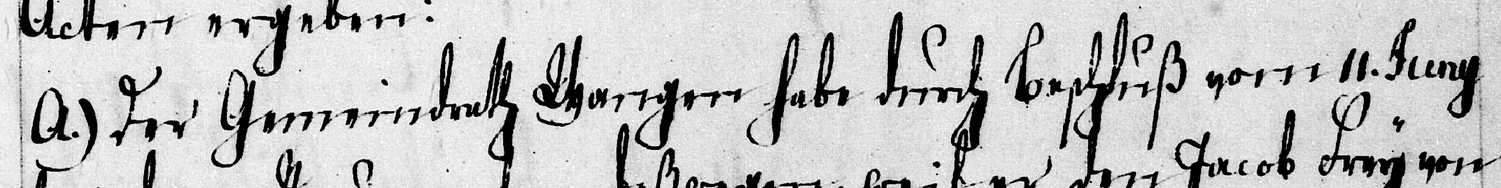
A.) Der Gemeindrath Wangen habe durch Beschluß vom 11. Juny
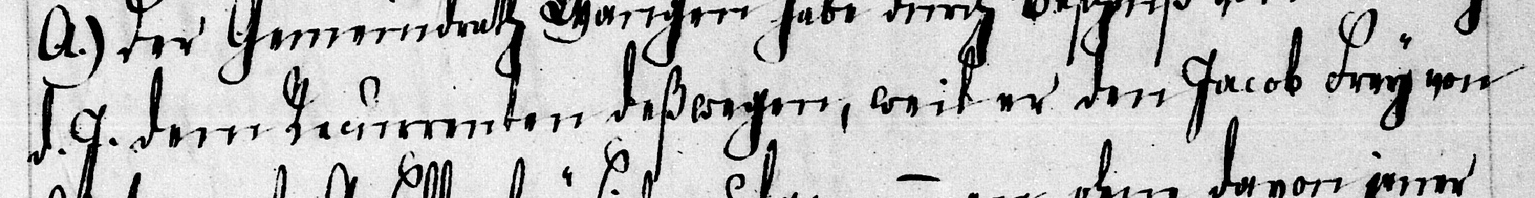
d. J. dem Recurrenten deßwegen, weil er den Jacob Frey von
